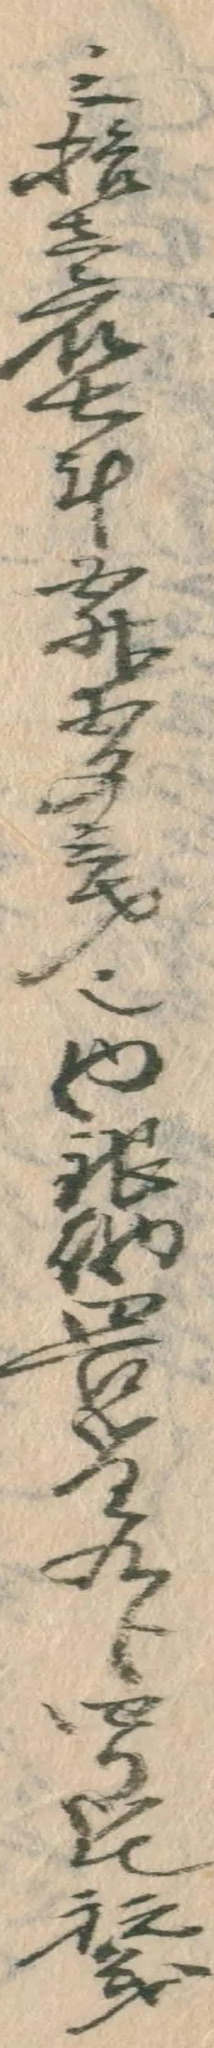三拾壱石七斗五升五夕三才也内銀納四百弐拾匁九分四厘四毛祝義
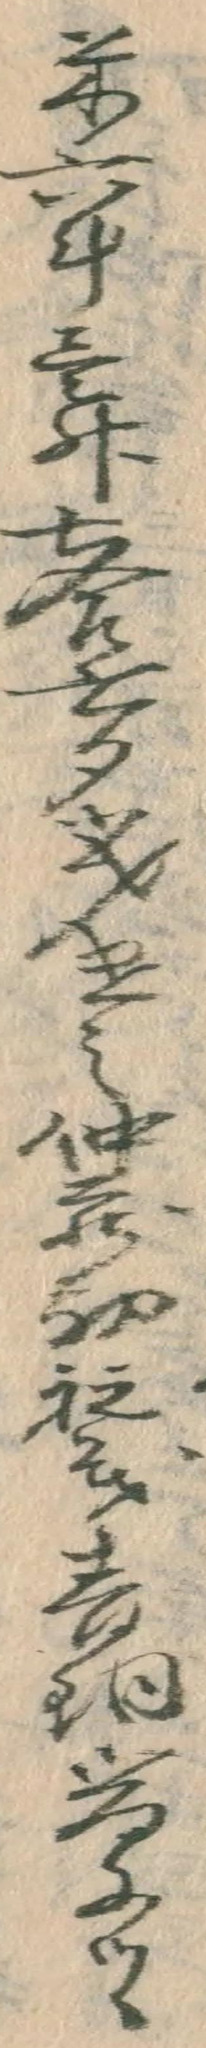米六斗壱升七合六勺弐才遣也仲蔵初祝義青銅弐百文ツヽ
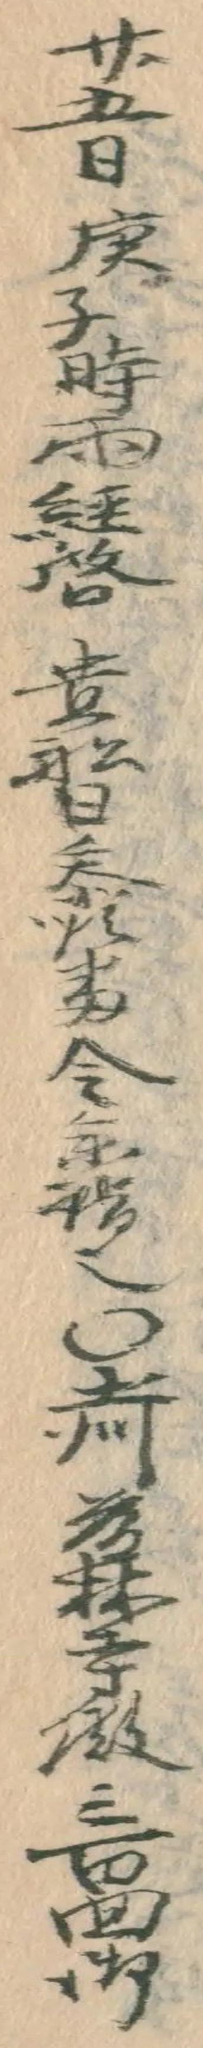廿五日庚子時雨経啓貴舩日参順番令参詣也○土州藤林寺殿三百回御

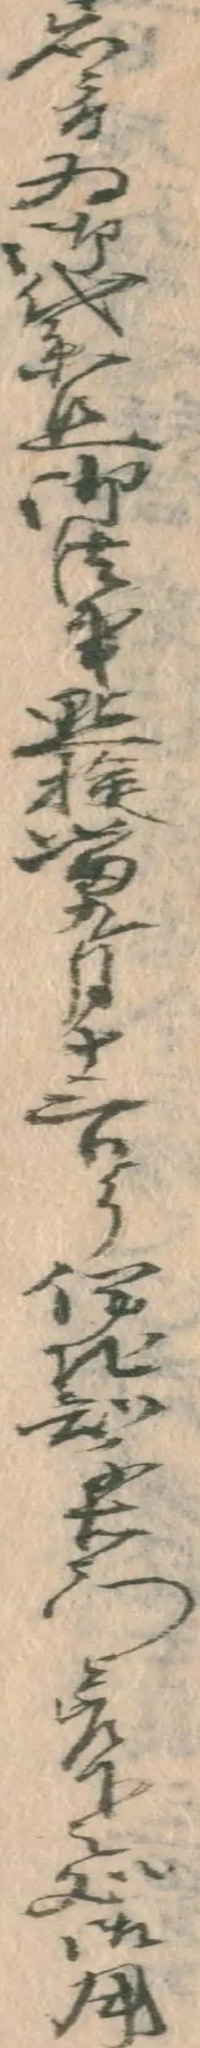忌ニ付為御代参上御法事黙検當九月十三日ゟ伊地知善右衛門差下之処御用
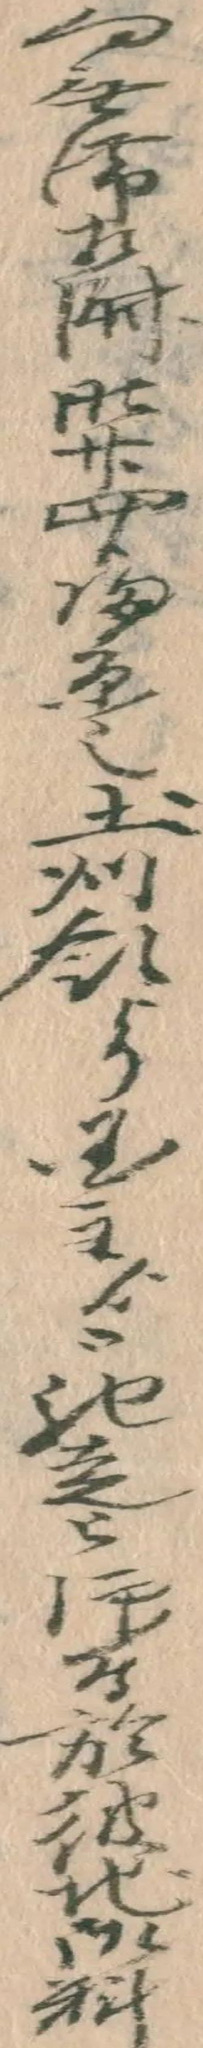向無滞相済昨廿四日帰京也土州領より国主ゟ御馳走被仰付於彼地御料
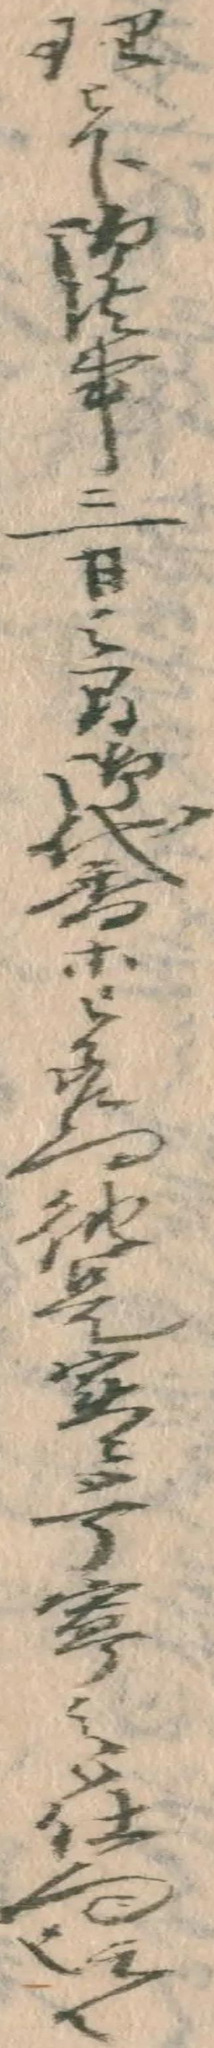理被下御法事三日之間御代番等被差向彼是実ニ御丁寧之御仕向也云々
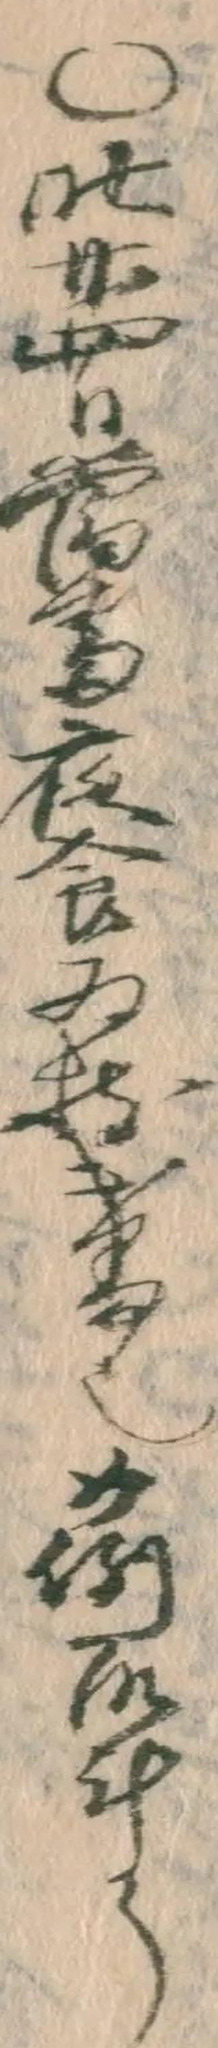○昨廿四日當番夜食為持出番也如例取斗也
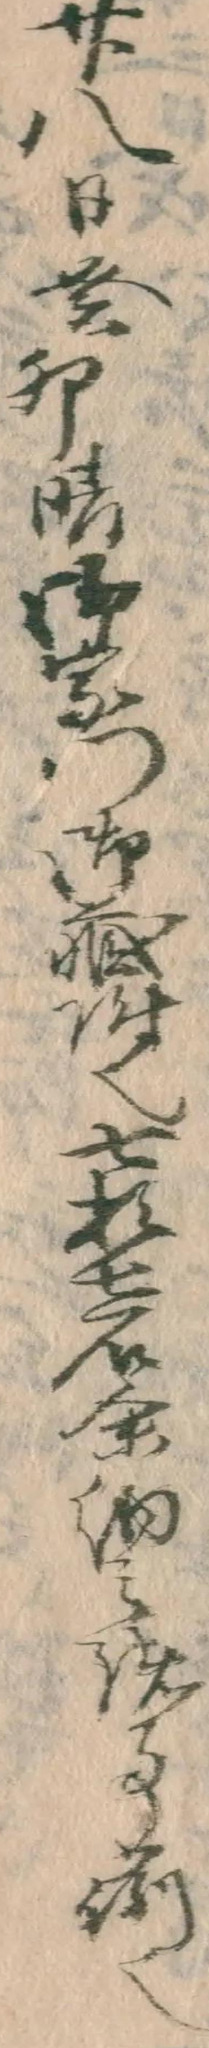廿八日癸卯晴御家門御蔵附也七拾七石余細之諸事如例也
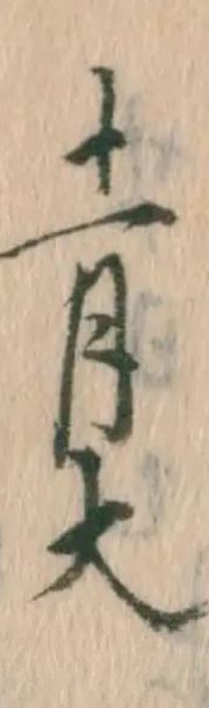十一月大
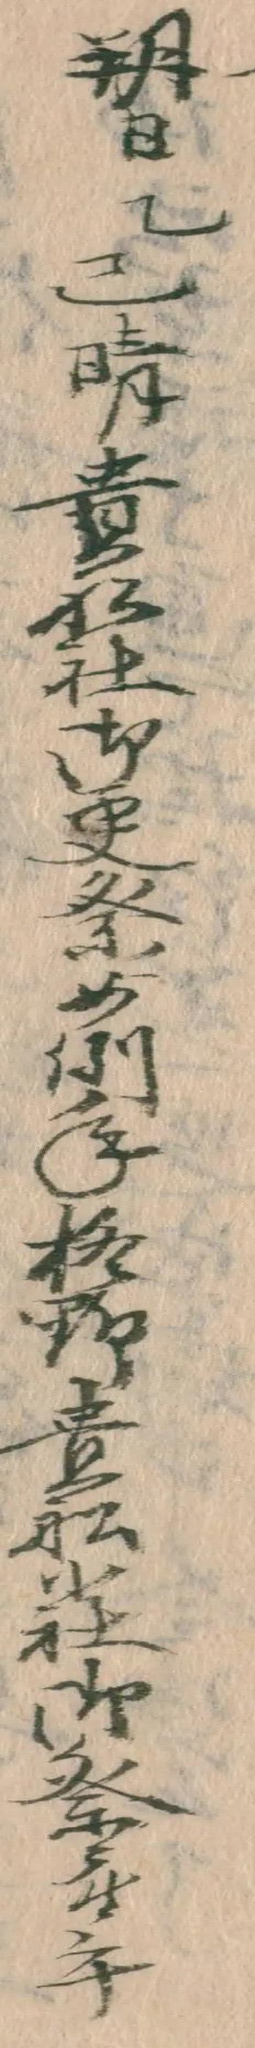朔日乙巳歳貴舩社御更祭如例年柊野貴舩小社御祭ニ付午
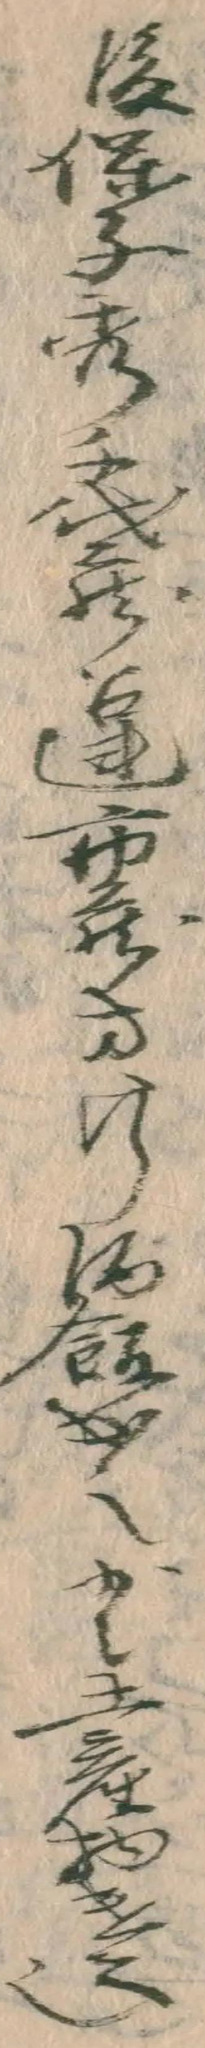後保子秀千代蔵召連市蔵方行酒飯出之少し土産物遣之也
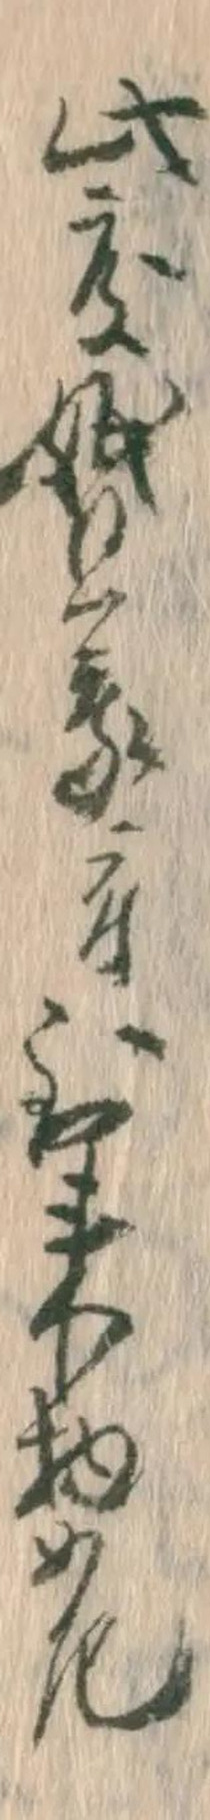此度婚義ニ付到来物如左
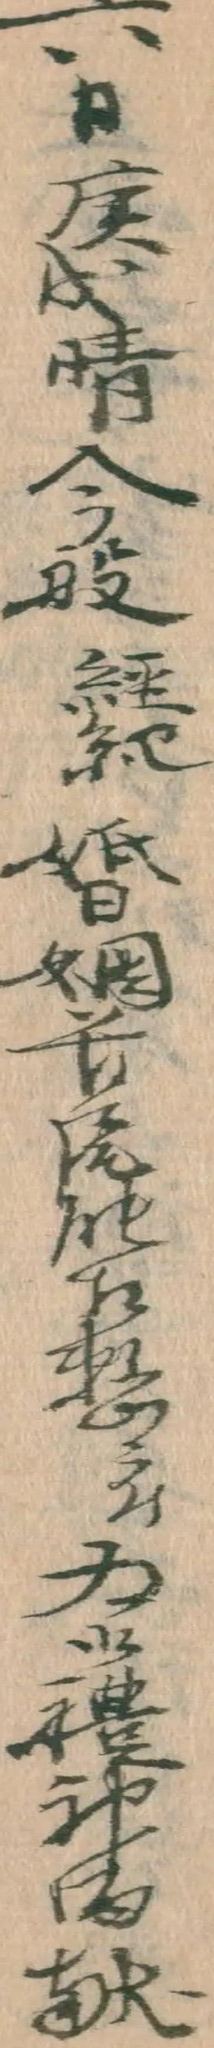六日庚戌晴今般経紀婚姻首尾能相整ニ付為御禮神酒献
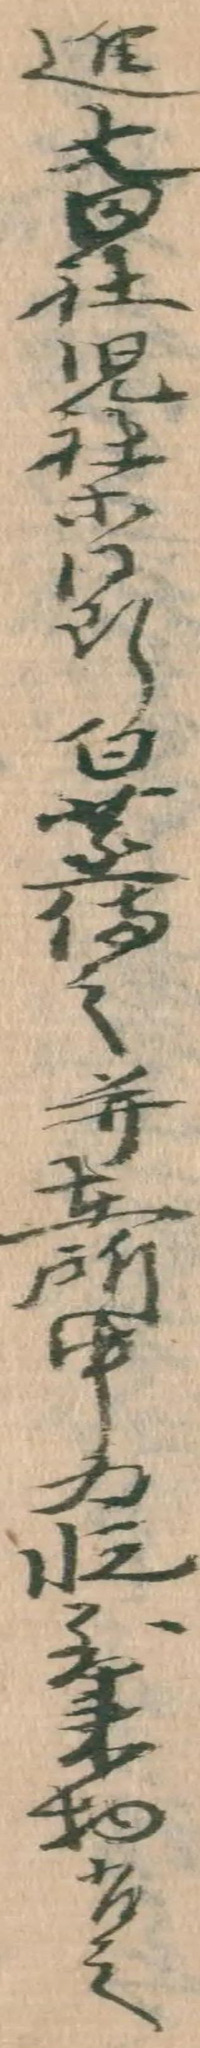進大田社児社等同断白蒸供之并在所中為祝到来物有之
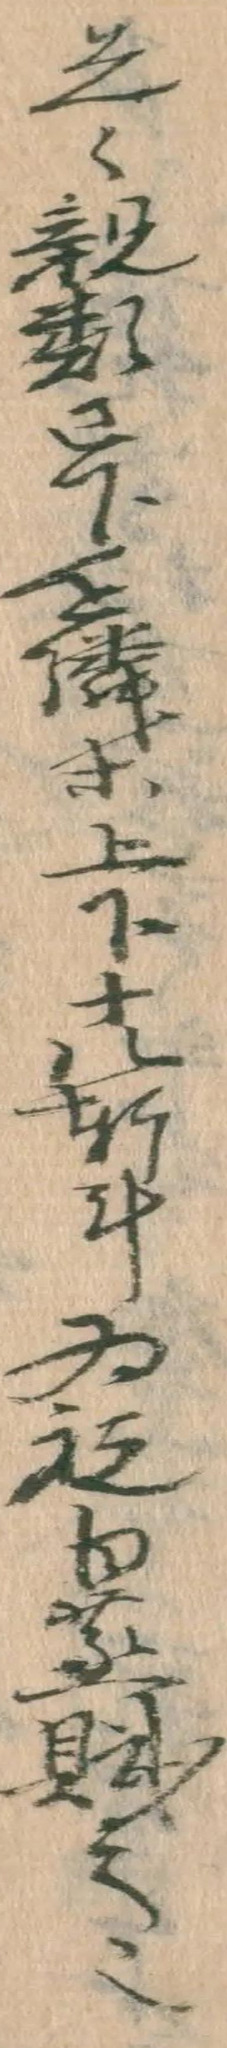先々親類已下近隣等上下十八軒斗為祝白蒸賦之也
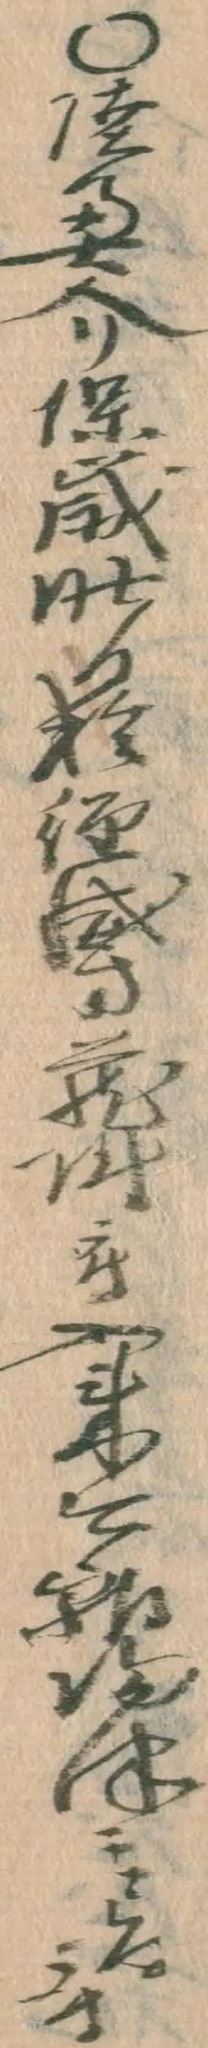○陸奥介保歳昨日於経威方蔵附ニ付入来今朝帰津之旨ニ付
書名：賀茂社記録. 第69冊
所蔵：国立国会図書館 National Diet Library, JAPAN
